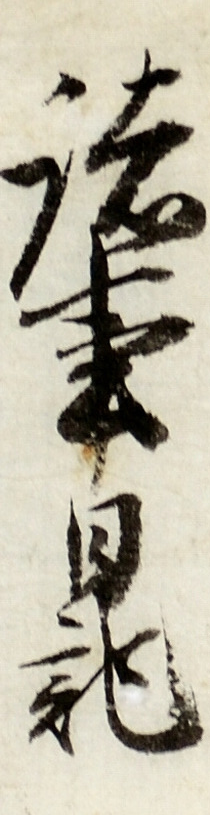諸事日記
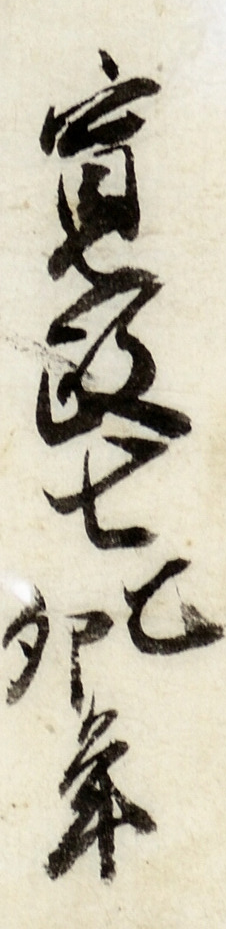寛政七乙卯年
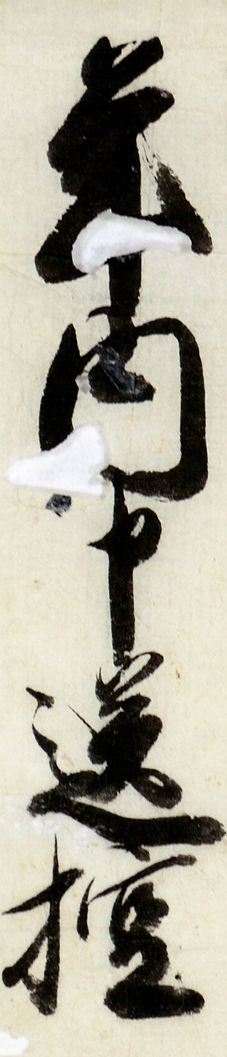年内申送控
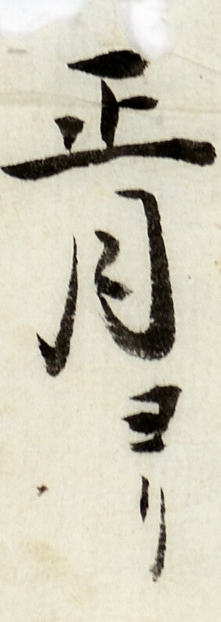正月ヨリ
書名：諸事日記年内申送控
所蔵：伊那市立高遠町図書館・合同会社AMANE
